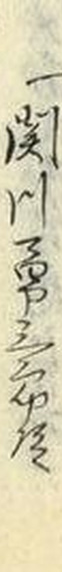関川勇三郎殿
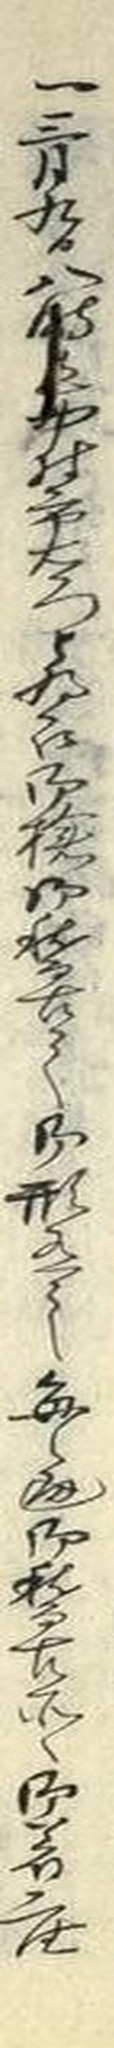一三月九日八時過中村市右衛門被為召御槍御稽古有之御形有之毎之通御稽古所へ御着座
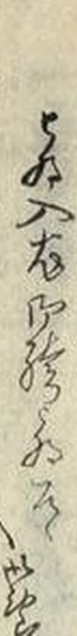被為入尤御袴被為召候
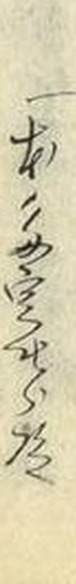本多定次郎殿
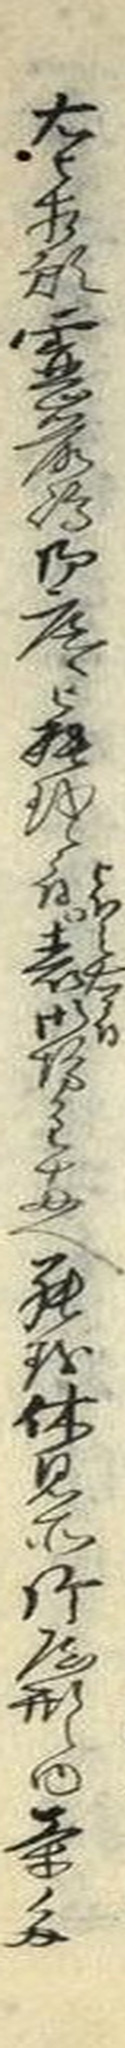右被相願霊厳島御庭へ被罷越候ニ付被下之右ニ付表御坊主両人罷越休息所御屋形之内茶た
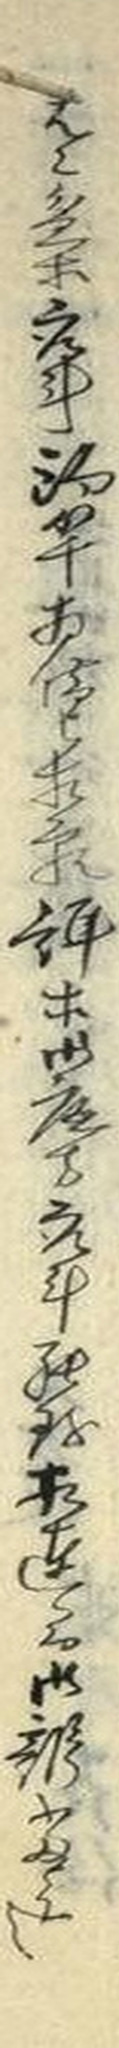はこ盆等取計釣竿拝借被相願餌等御庭方取計罷越相達候而御弁当被下之

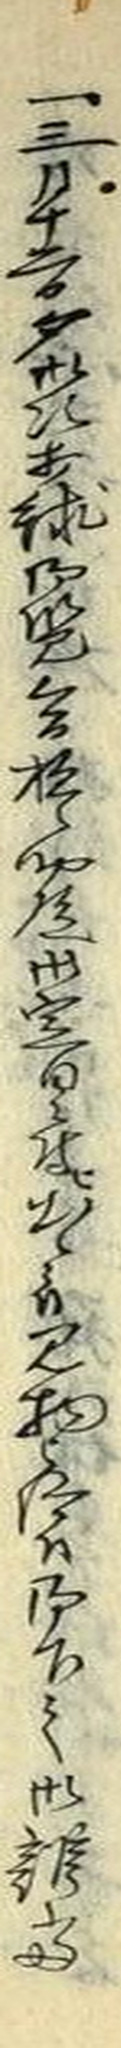一三月十二日夕御次打毬御覧今日桓之助殿御定日ニ付被出候ニ付見物被仰付御下之御弁当
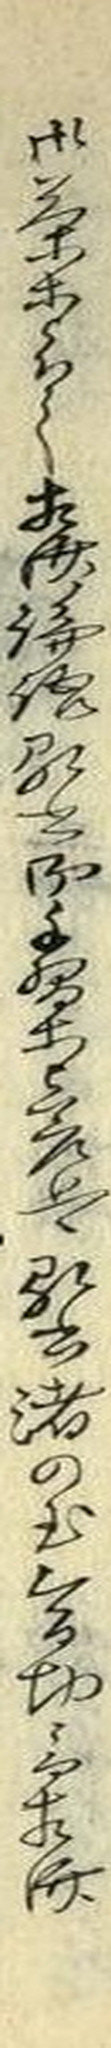御茶等被下之相済論語歌書御手習等被差上候歌書渚の玉今日切ニ而相済
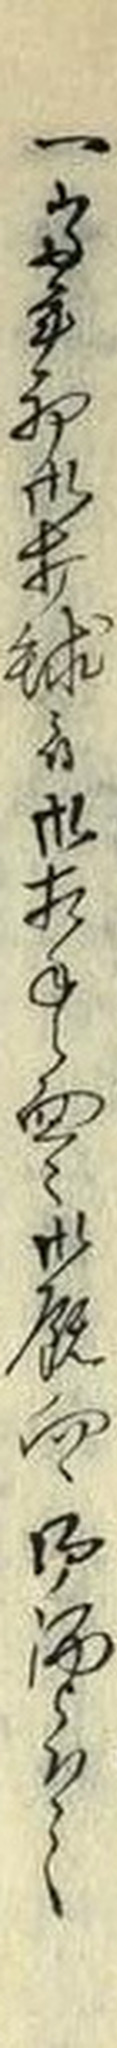一当年初御打毬ニ付御相手之面々御厩向へ御酒被下之
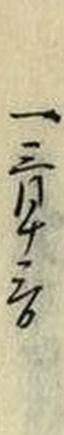一三月十四日
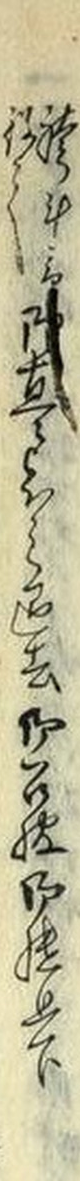役之御直ニ被下之退去御召服御継上下
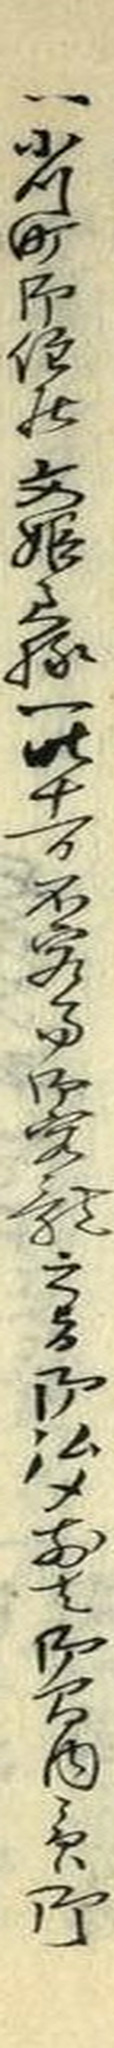一小川町御住居文姫君様一昨十一日不容易御容体之旨御弘メ前者御間内ニ而ハ御
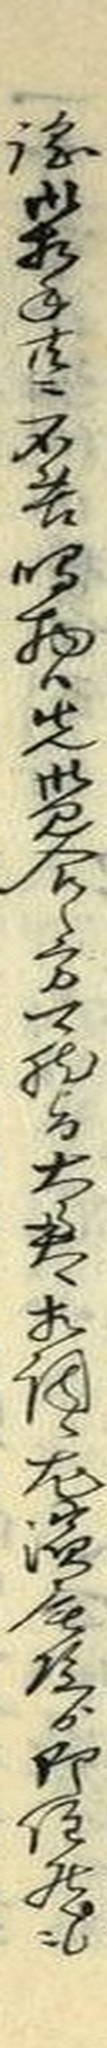謡御相手共ニ不苦鳴物ハ先御見合之方可然旨大奥へ相伺候尤浜尾殿ゟ御住居へも
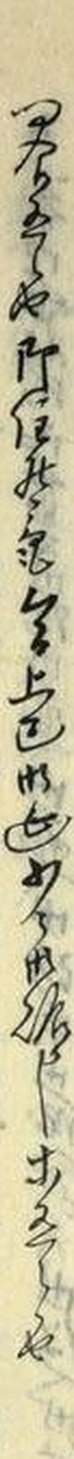問合有之由御住居ニ而も今日上巳御延少々御賄申し等有之候由
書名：少傅日録抄（斉善付側向頭取日記、在府）
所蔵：福井県文書館 Fukui Prefectural Archives
